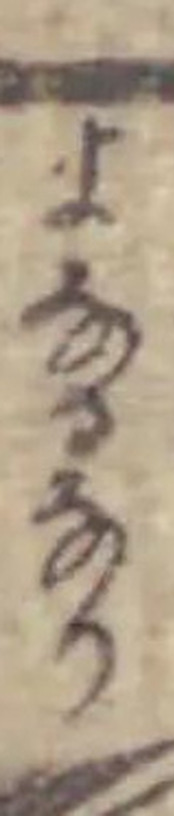よなるなり
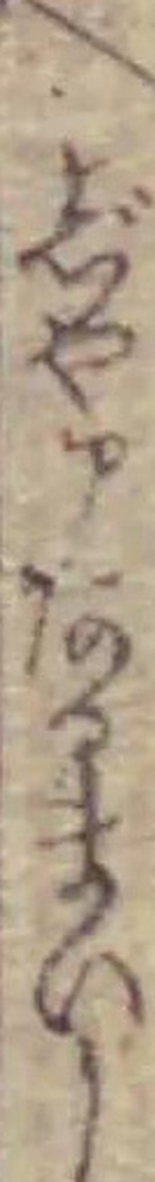じやアあるまいし
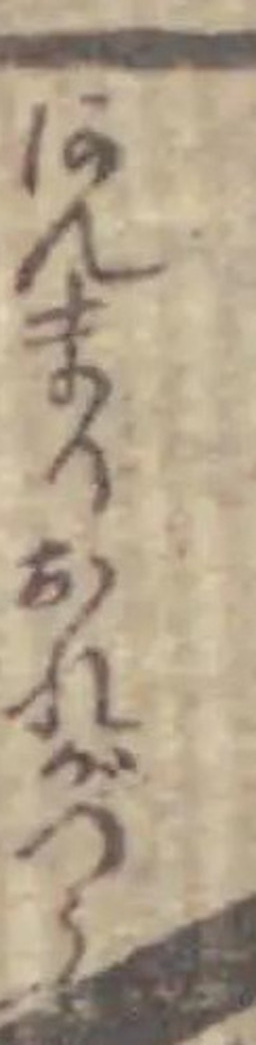あんまりおれがつう
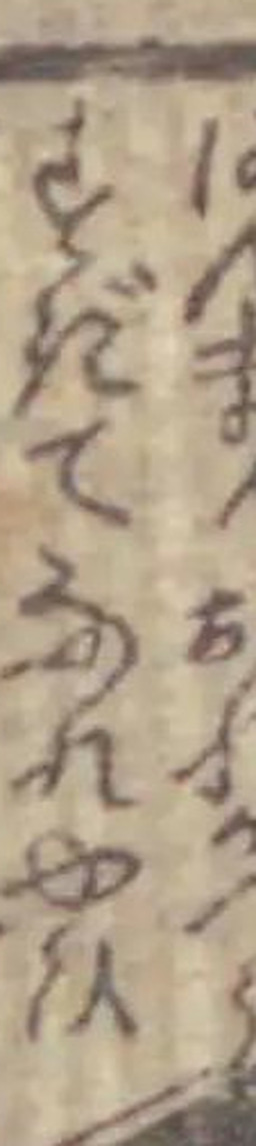すぎてなれやひ
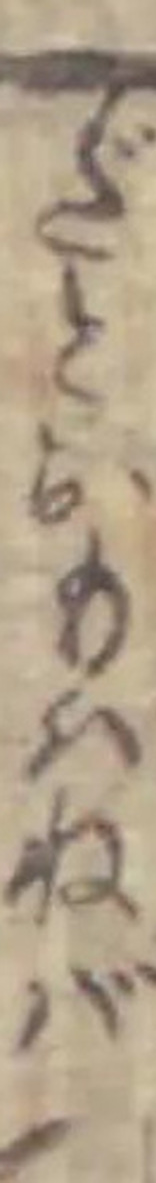だとおもはねば
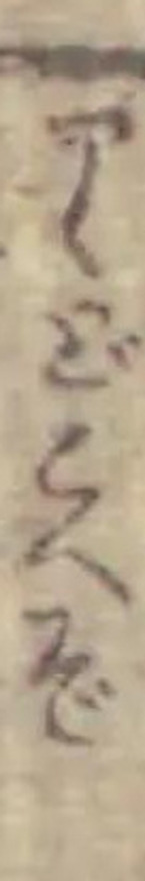アゝどこへぞ
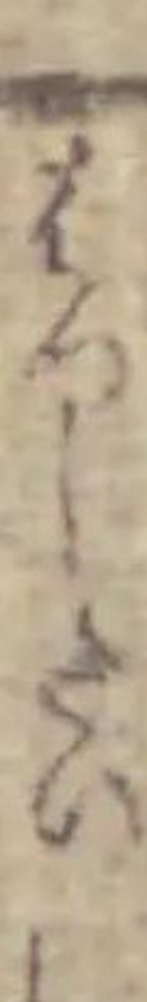はづしたい
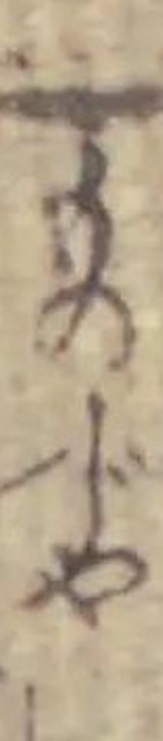ものじや
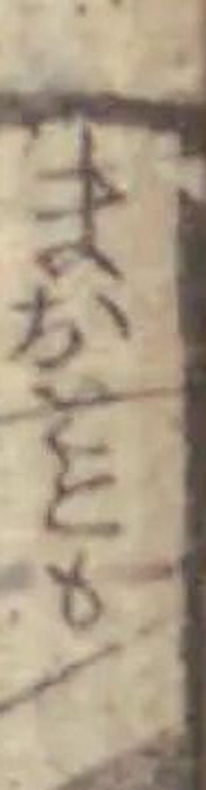まおとこも
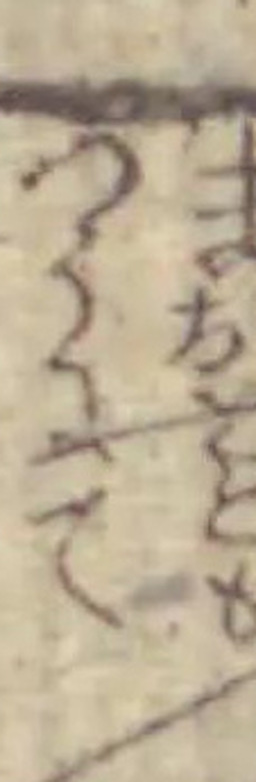つうにて
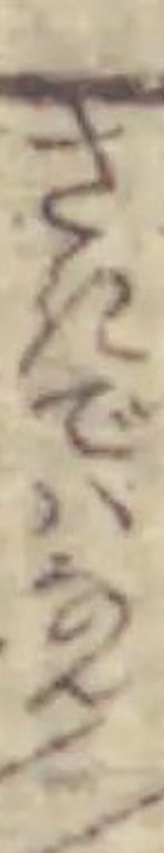さきではなん
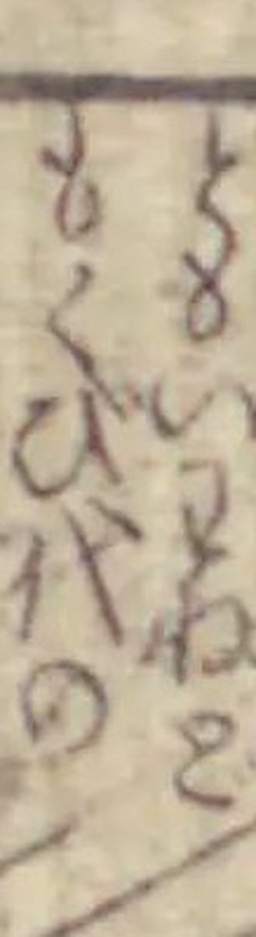もくび代の
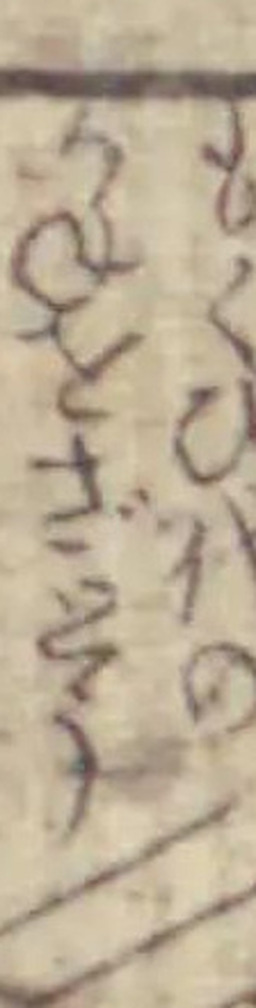かねをざとう
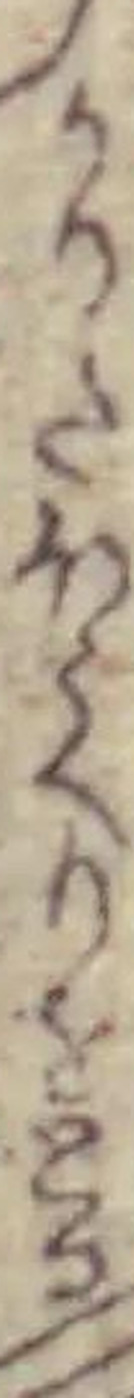かりたほうへりをとる
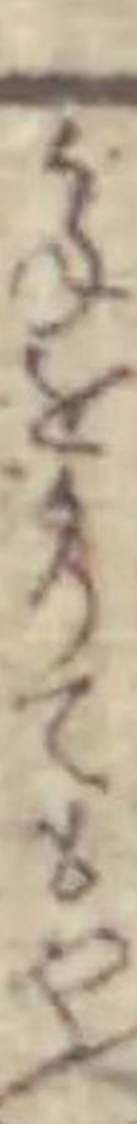かねをかりてもや
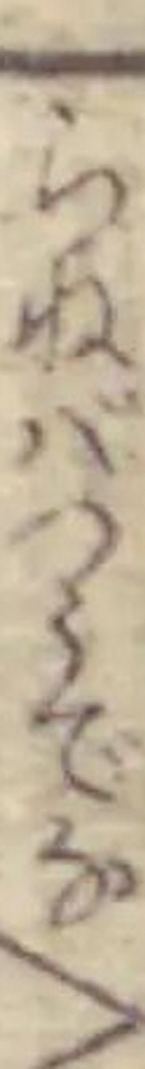らねばつうでな
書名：茶羅毛通人 3巻
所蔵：国立国会図書館 National Diet Library, JAPAN
